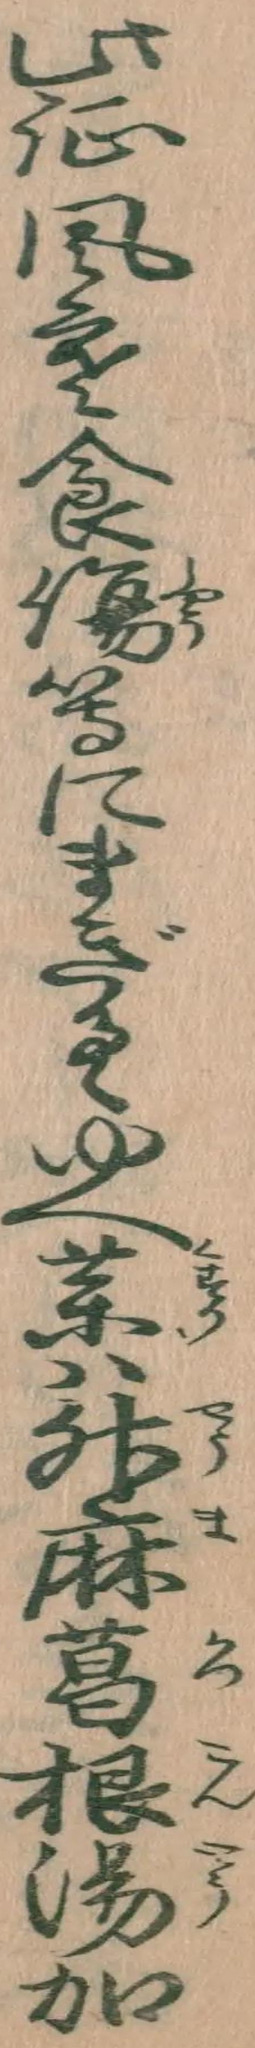此証風寒食傷等にまぎるゝゆへ薬は升麻葛根湯加
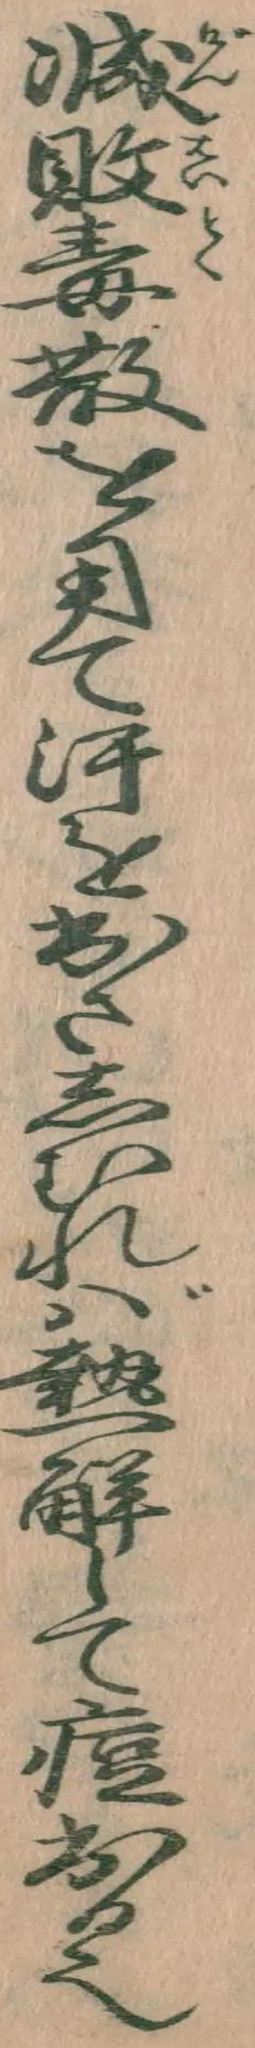減敗毒散を用て汗を出さしむれば熱解して痘出る也
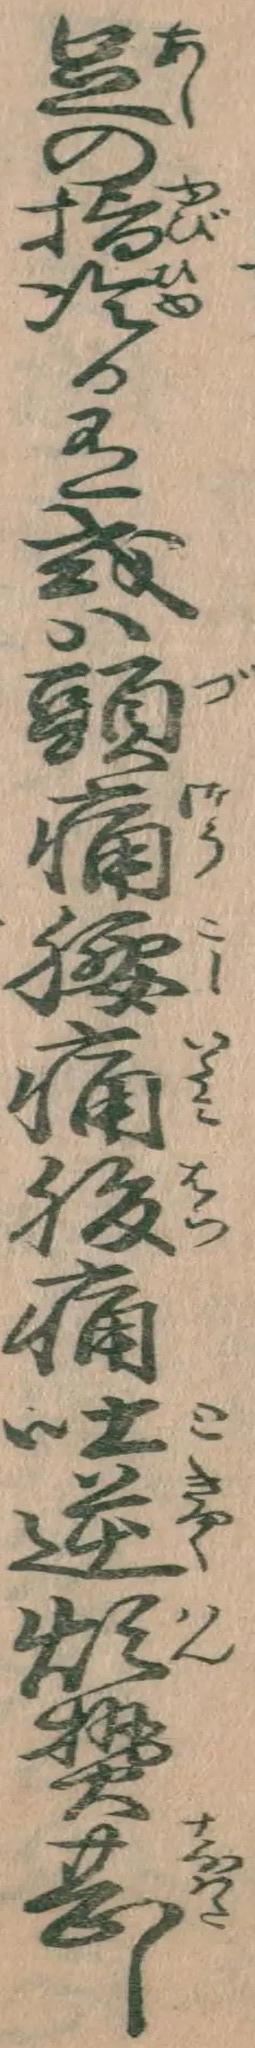足の指冷る有或は頭痛腰痛腹痛吐逆煩熱甚し
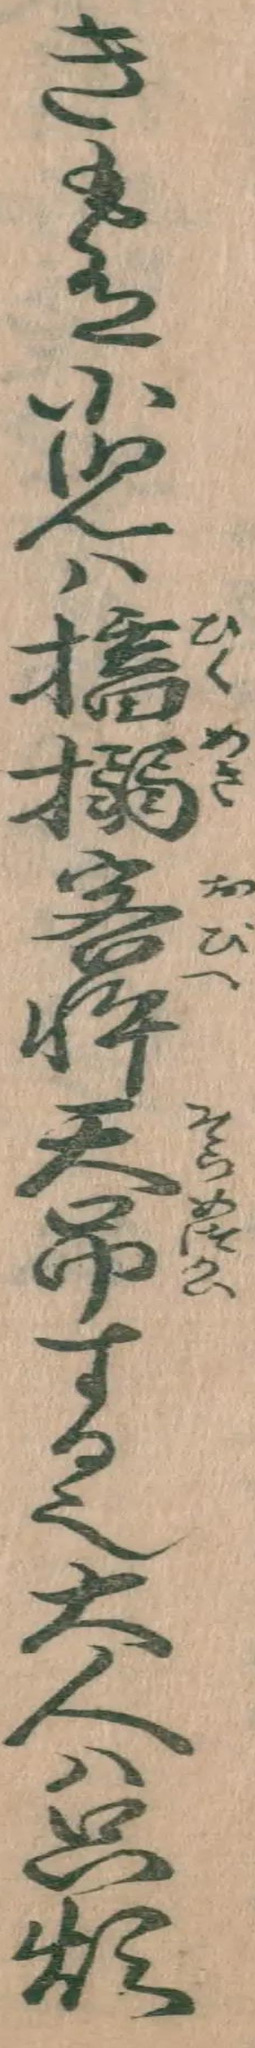きも有小児は搐搦客忤天吊する也大人は只煩
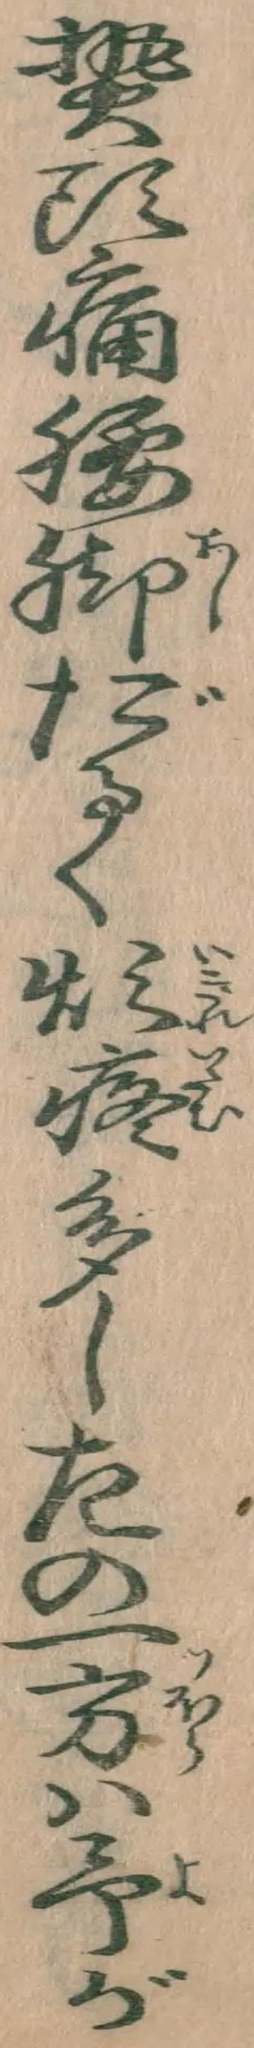熱頭痛腰脚だるく煩疼多し左の一ッ方は予が
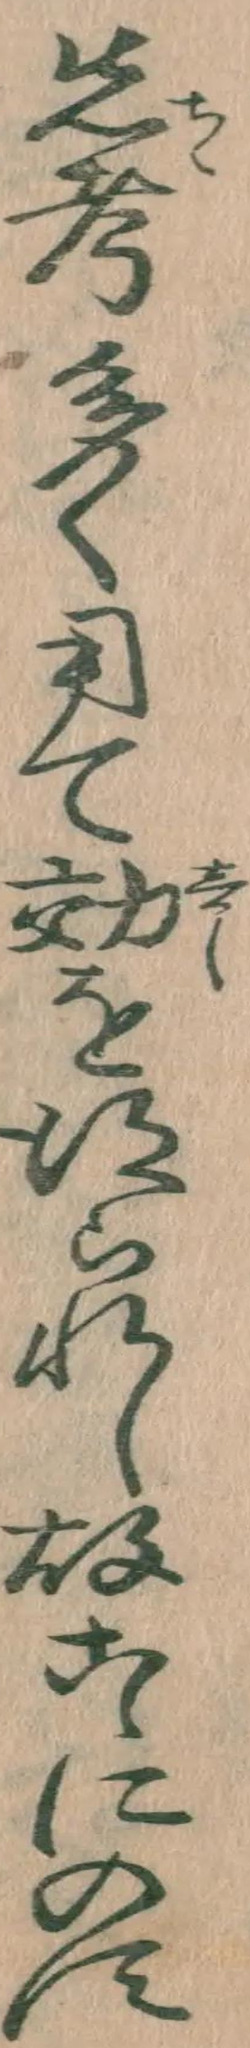先考多く用て効を得られし故こゝにのす

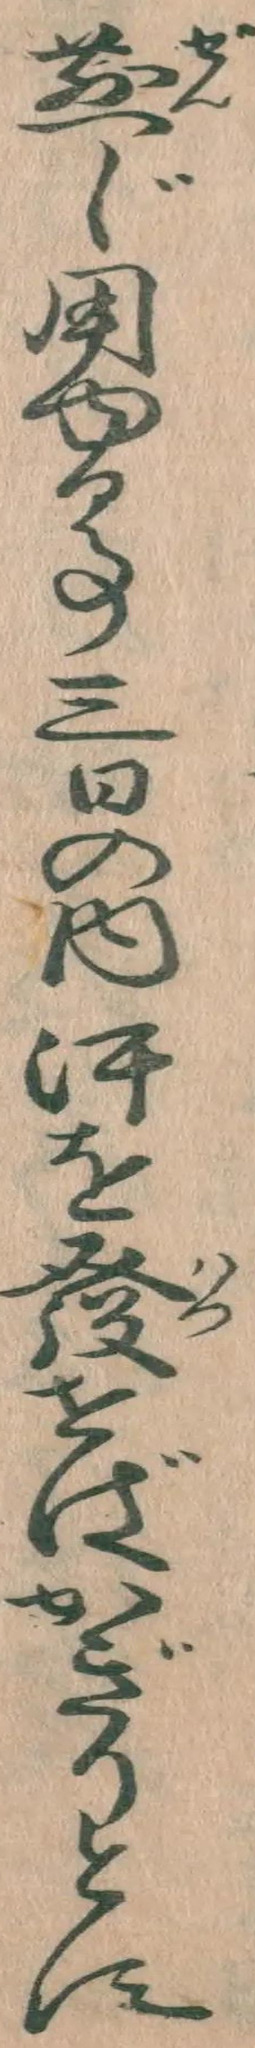煎じ用ゆる事三日の内汗を発せばかぎりとす
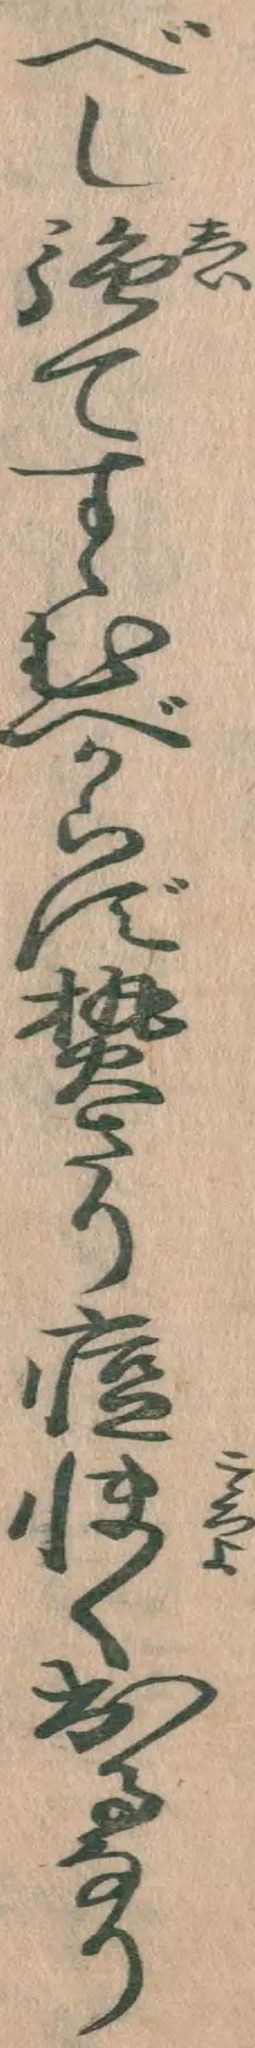べし強てすゝむべからず熱さり痘快く出るなり
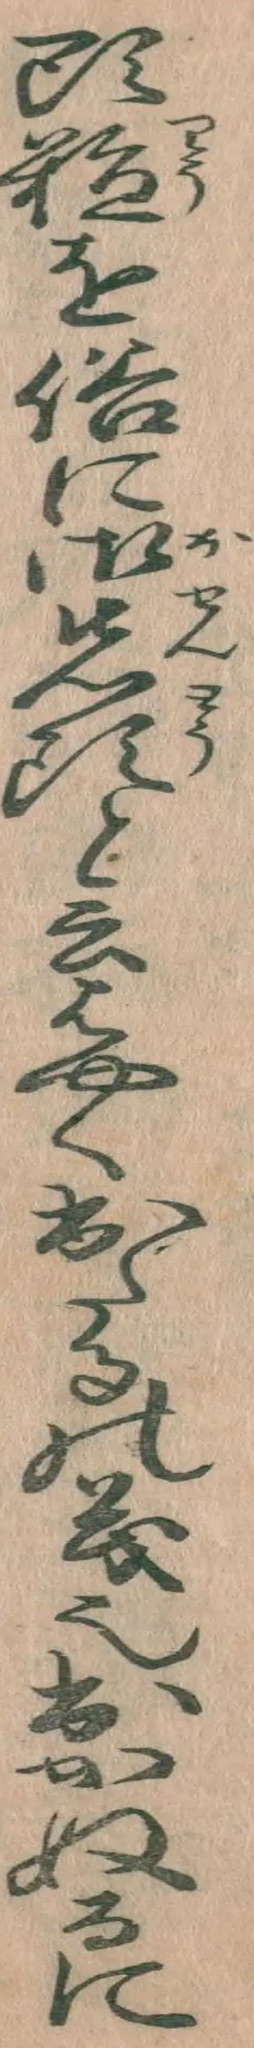頭粒を俗に御先頭と云はやく出たるの義也出かぬるに
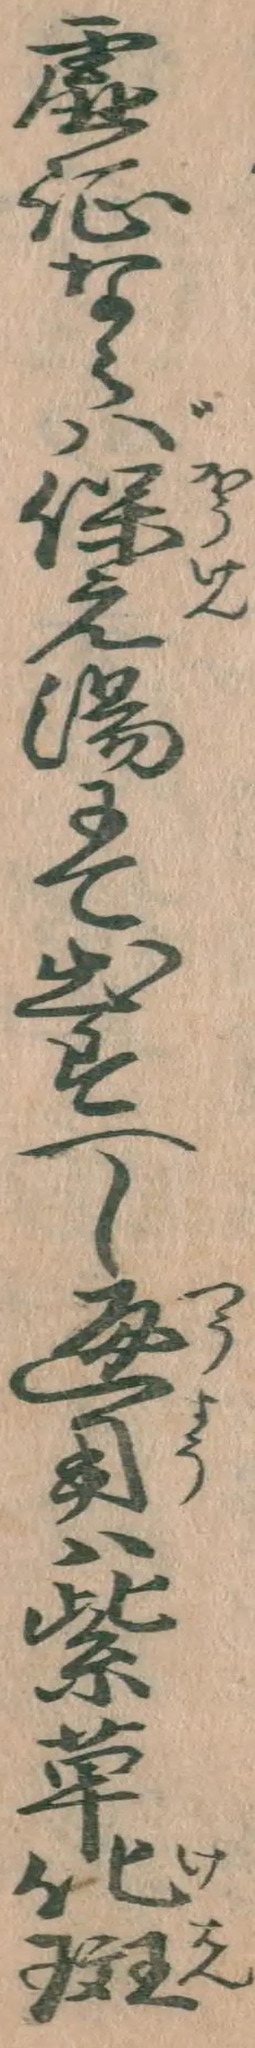虚証ならば保元湯にて出すへし通用は紫草化斑
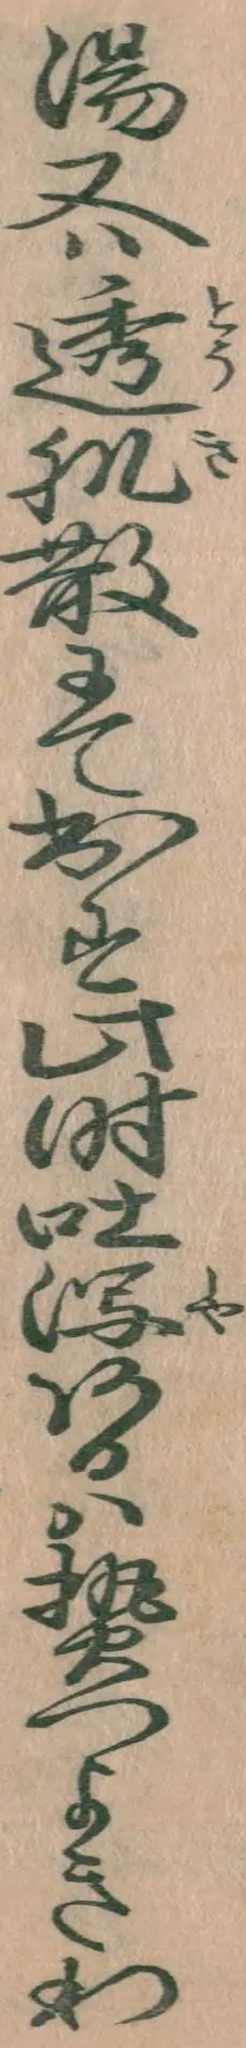湯又は透肌散にて出す此時吐瀉あるは熱つよきわ
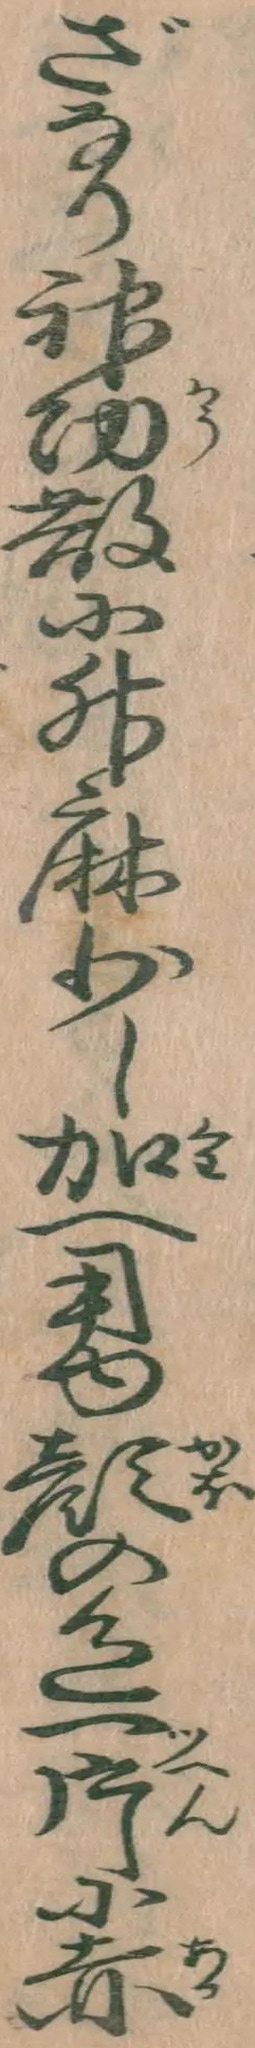ざなり神功散に升麻少し加へ用ゆ顔の色一ッ片に赤
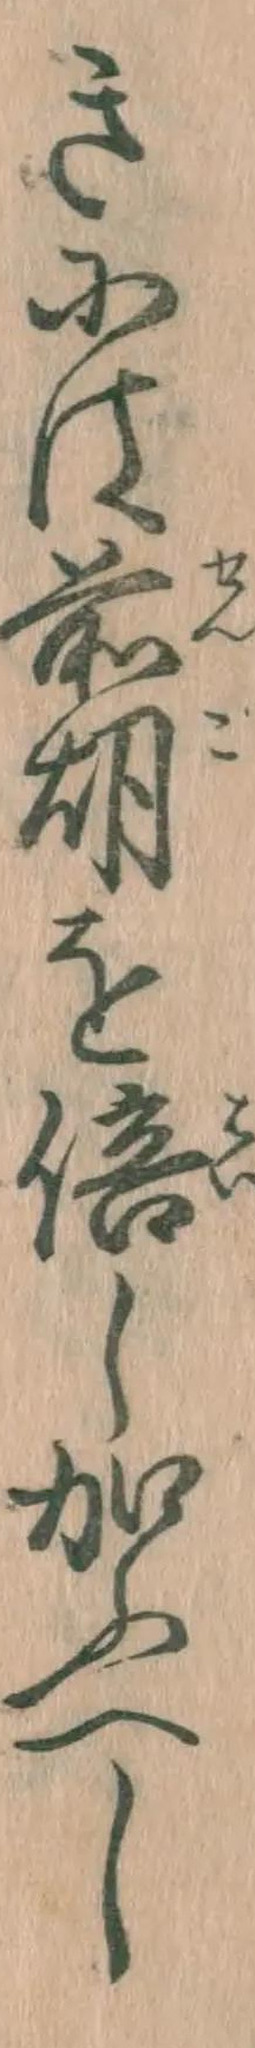きには前胡を倍し加ふへし
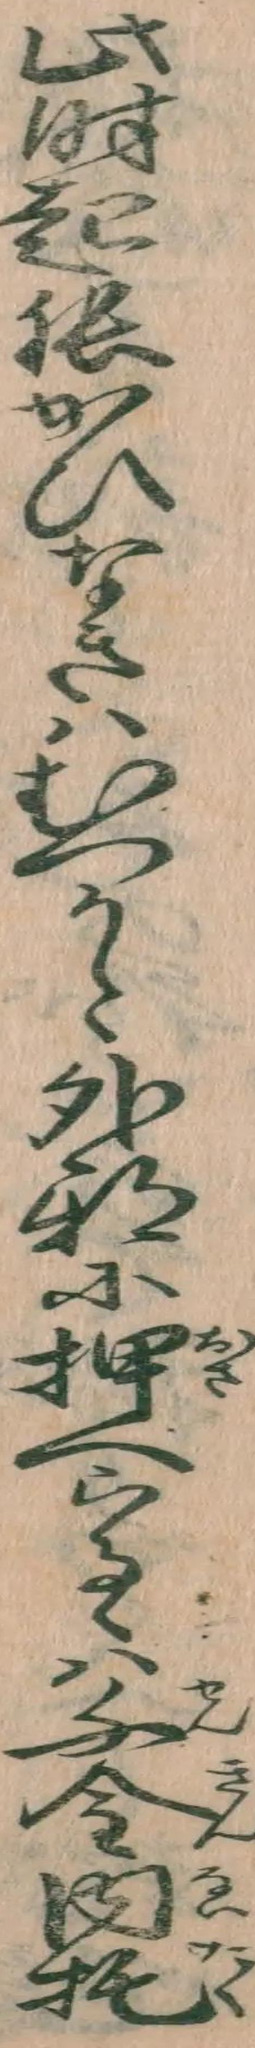此時起脹かひなきはむつかしく外邪に押へらるゝは千金内托
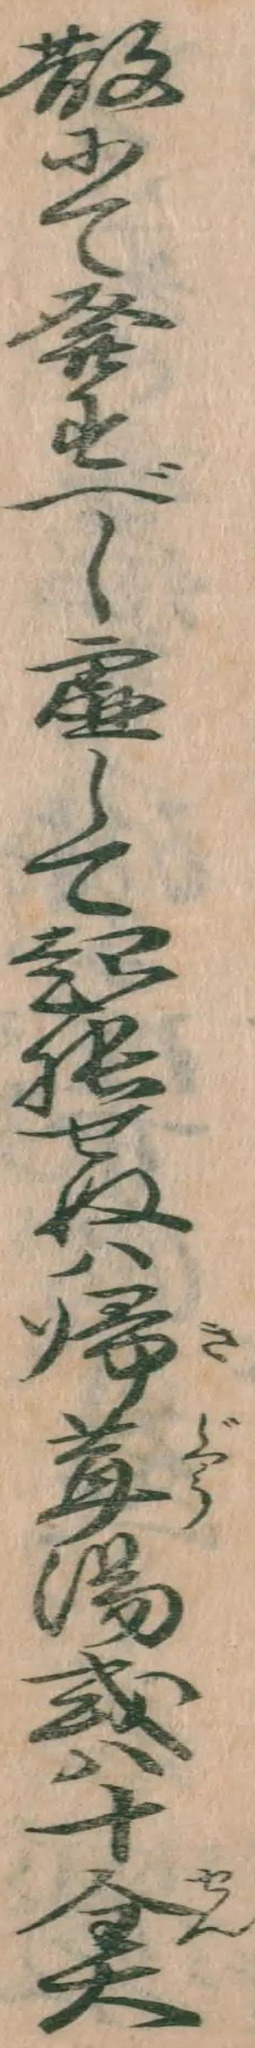散にて発すべし虚して起脹せぬせぬは帰茸湯或は十全大
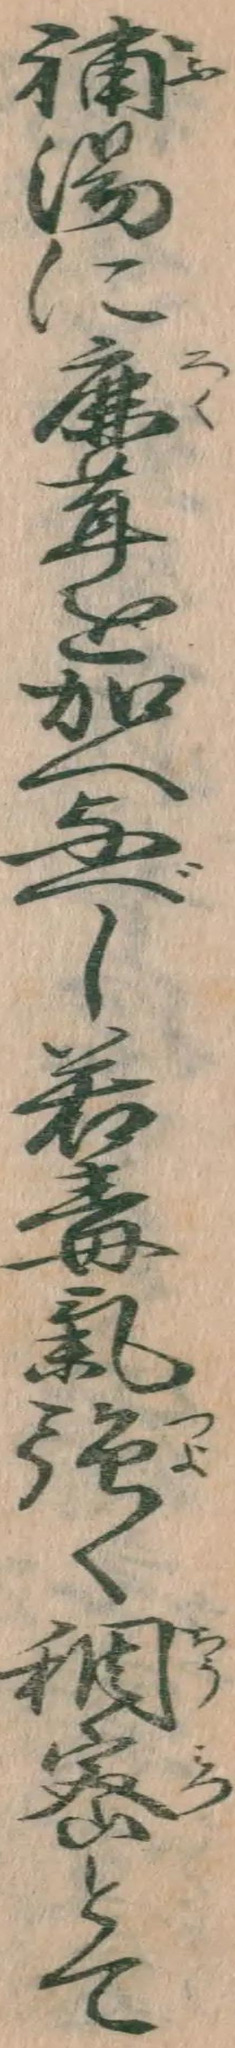補湯に鹿茸を加へ与べし若毒気強く稠密とて
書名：痘家初心問答
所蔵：国立国会図書館 National Diet Library, JAPAN
